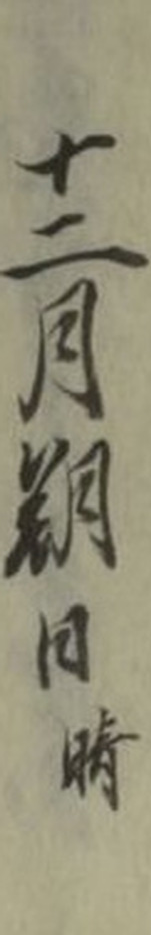十二月朔日晴
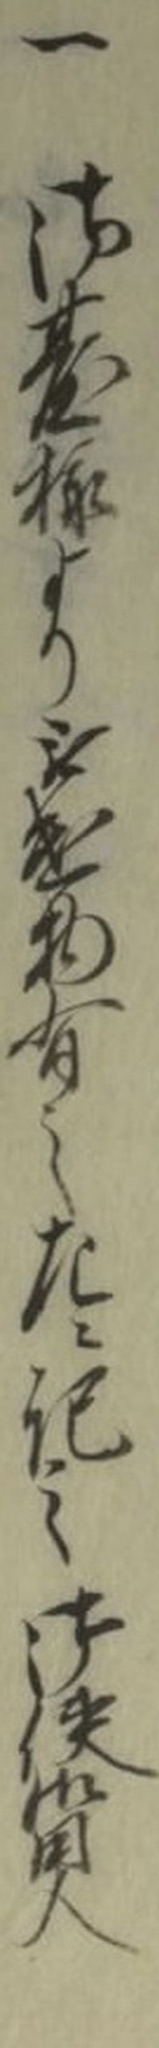一御台様より被遣物有之左に記之御使御用人
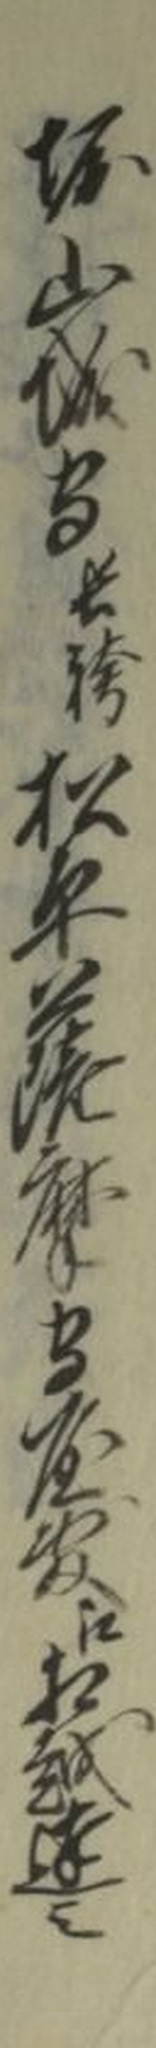堀山城守長袴松平薩摩守屋敷え相越達之

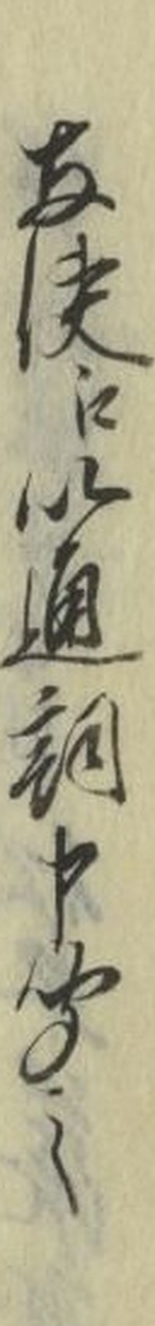両使え以通詞申聞之
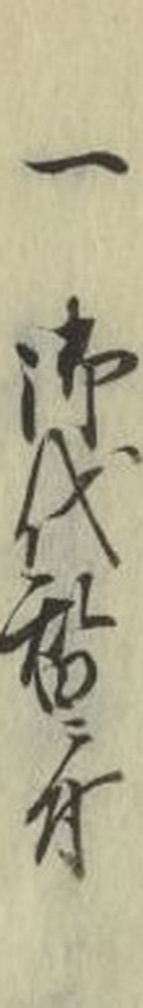一御代替に付
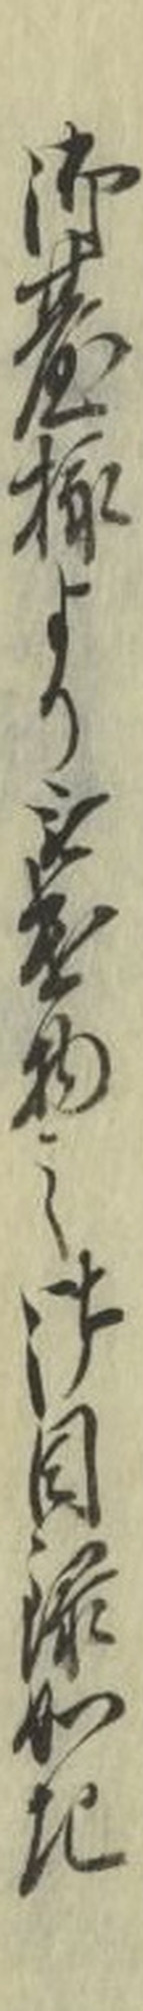御台様より被遣物之御目録如左
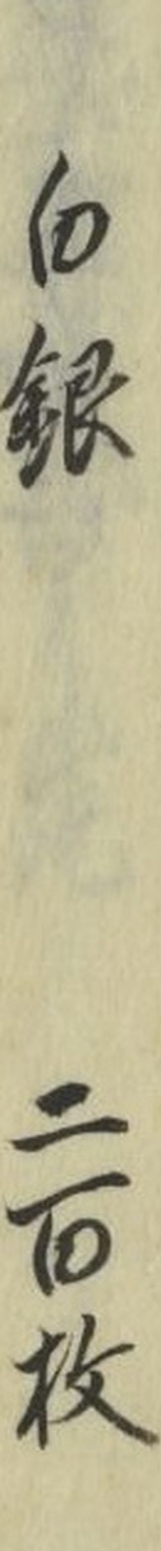白銀二百枚
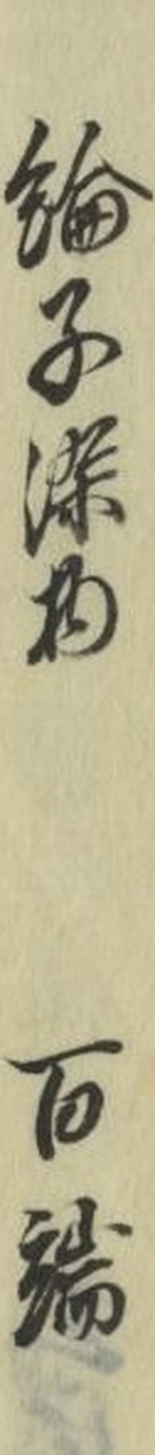綸子染物百端
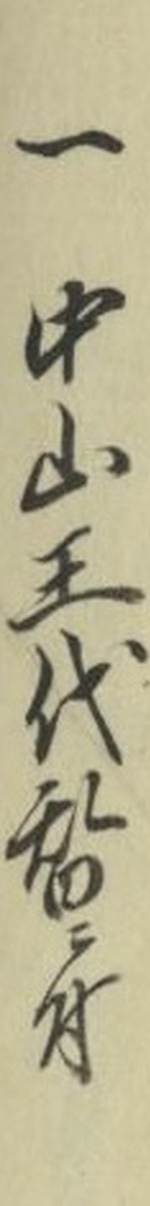一中山王代替に付
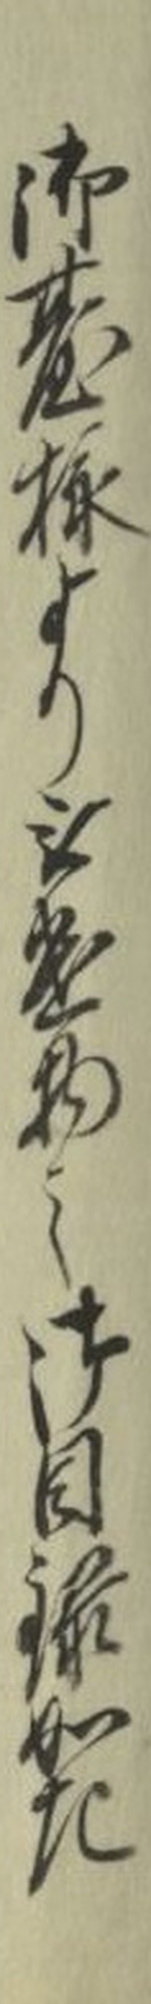御台様より被遣物之御目録如左
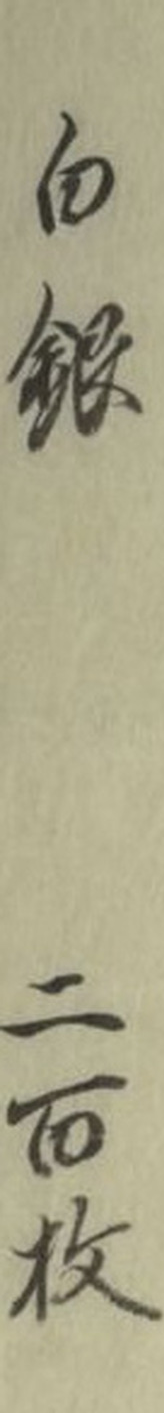白銀二百枚
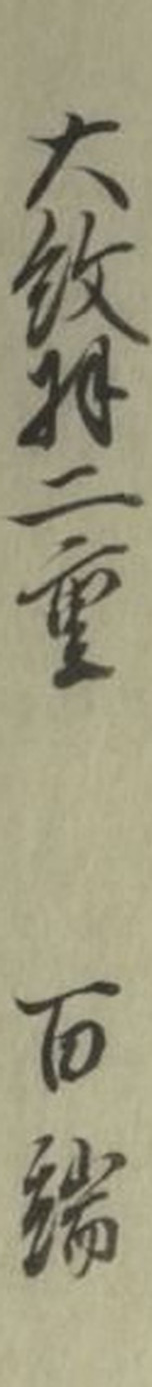大紋羽二重百端
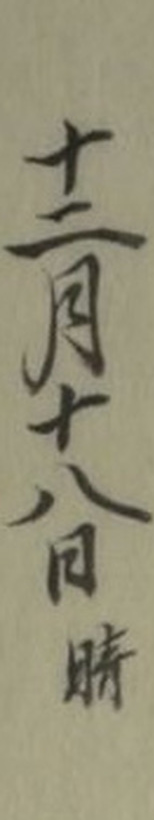十二月十八日晴
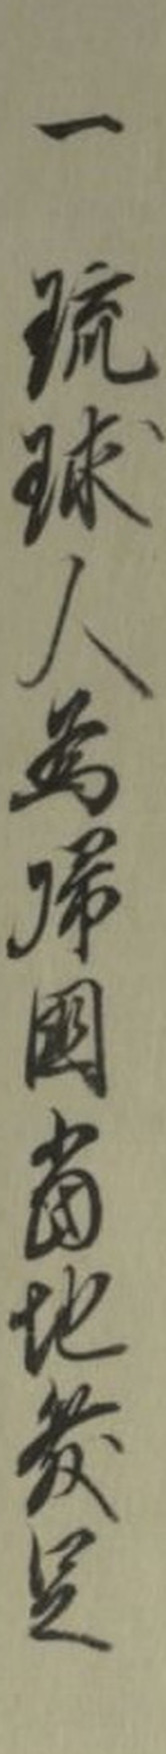一琉球人為帰国当地発足
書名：琉球人参府記
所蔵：University of the Ryukyus Library
